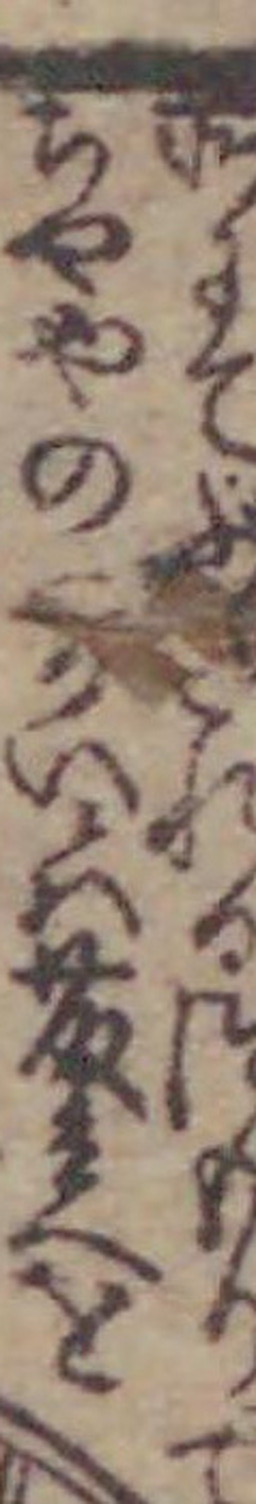ちややの二かいには藤兵衛を
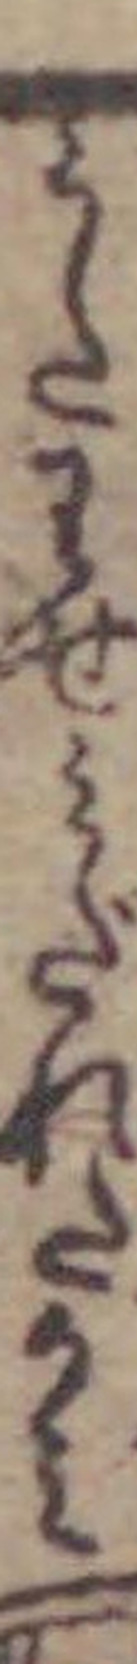うたわせみだれたかみ
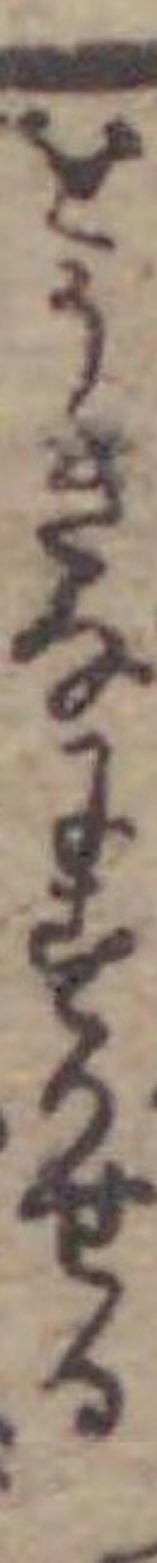をうきなにすかせる
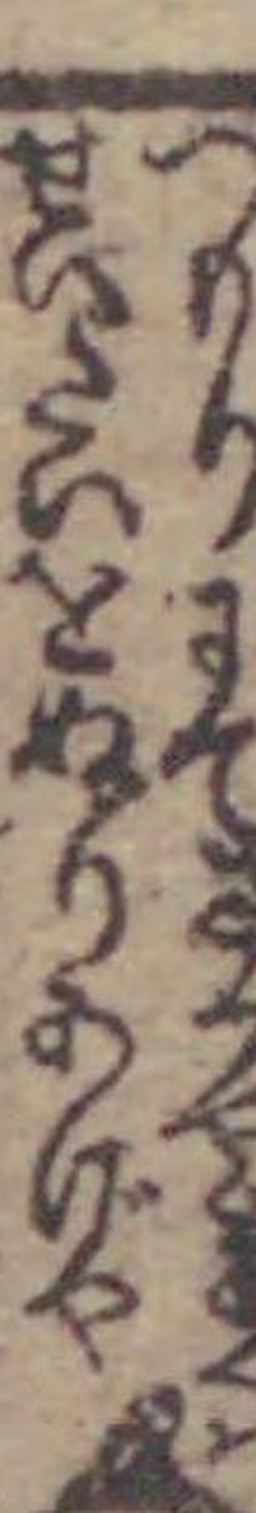せいたいをぬりあげや
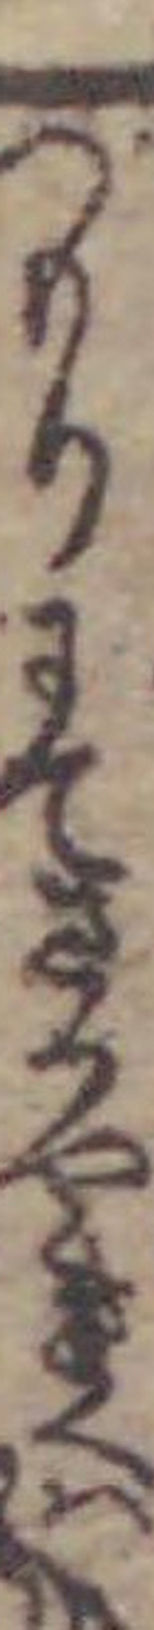つもりにてさかやきへは
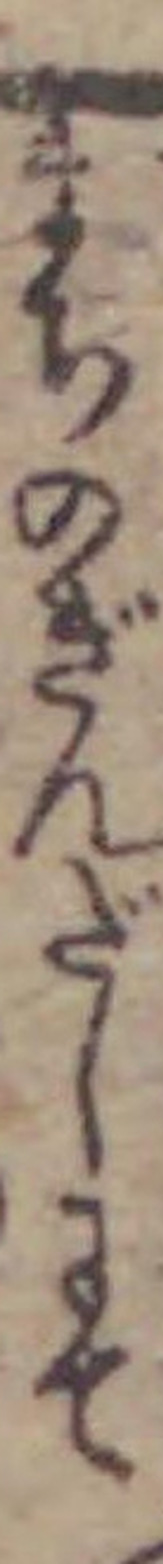まちのぎんだしにて
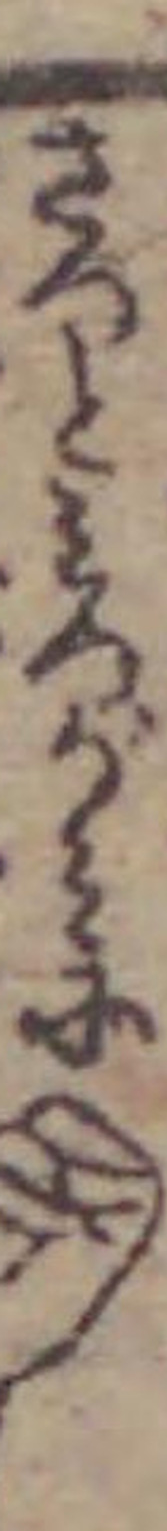さつとみつがみに
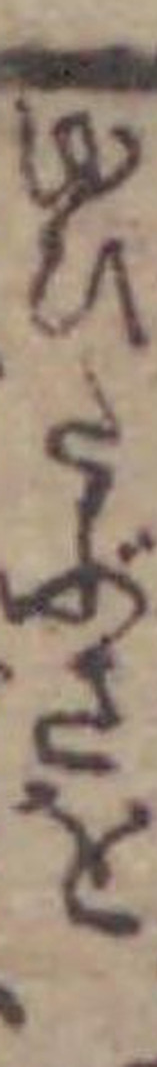ゆひたぶさを
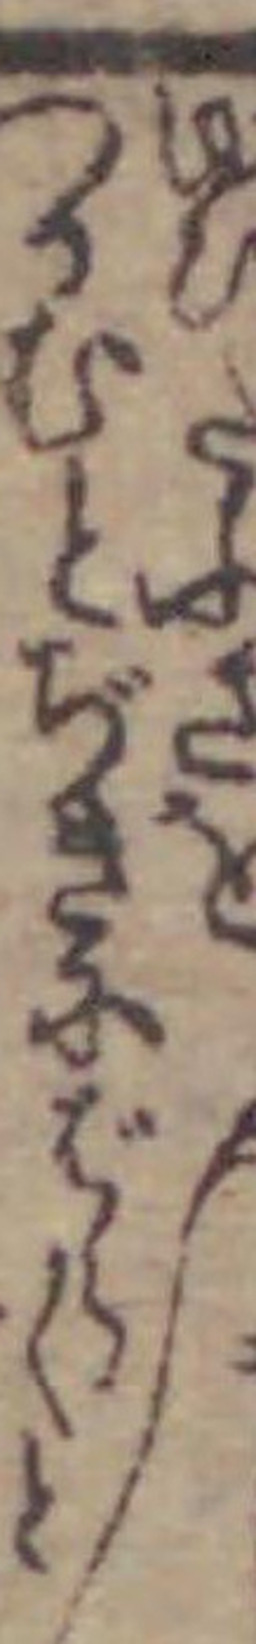つかむとぢきにばら〳〵と
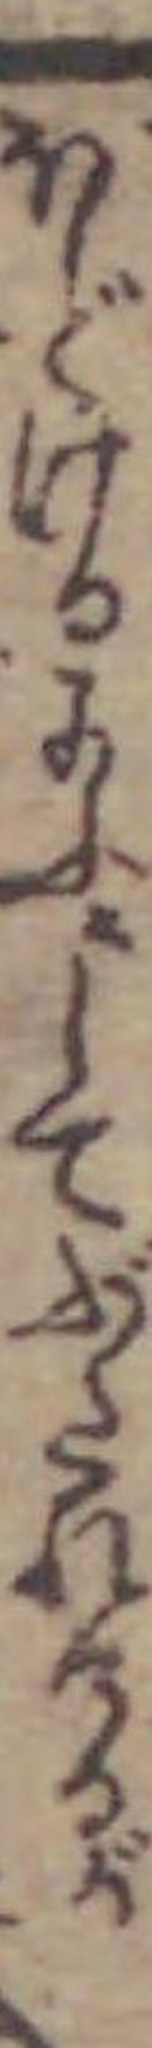ほどけるよふにしてぶたれけるが
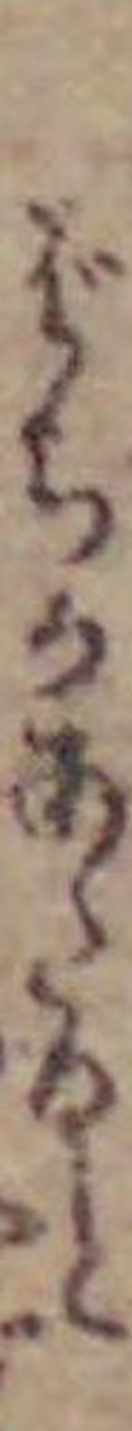ばちがあたると
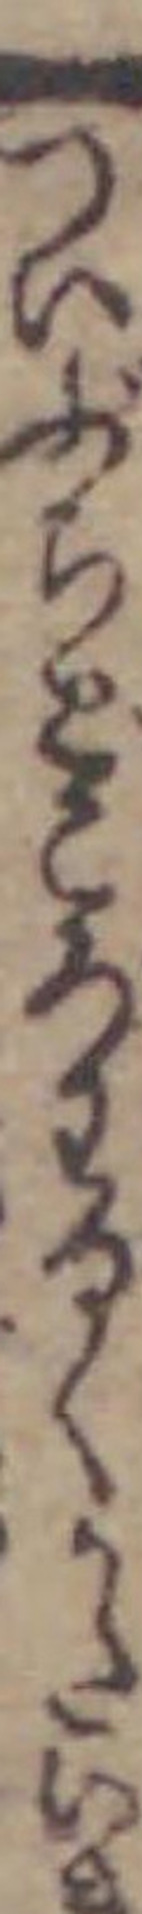ついぶちどころわるくかたいきに
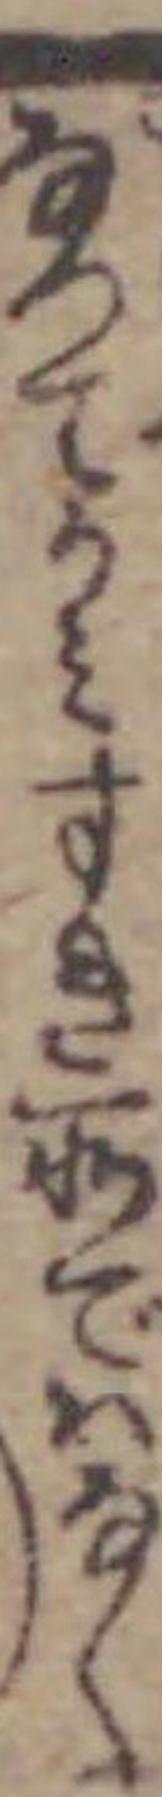なつてかみすき所ではなく
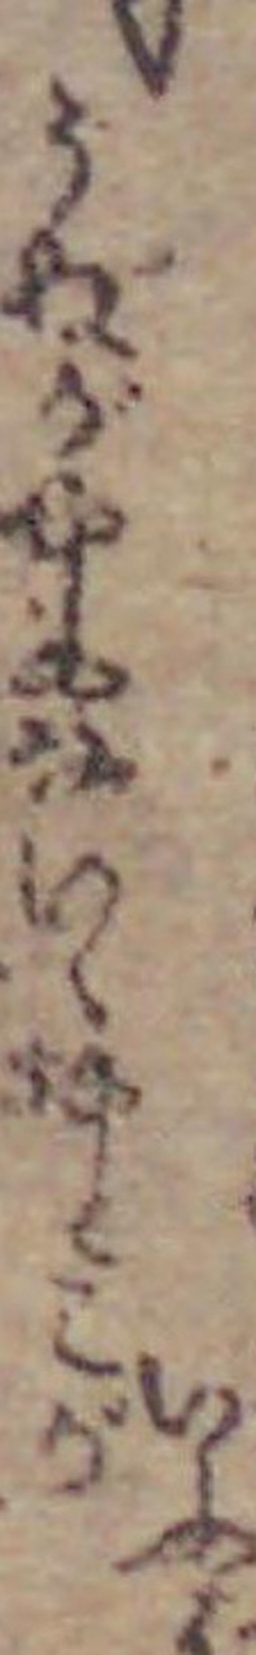うぬがやふないゝおとこが
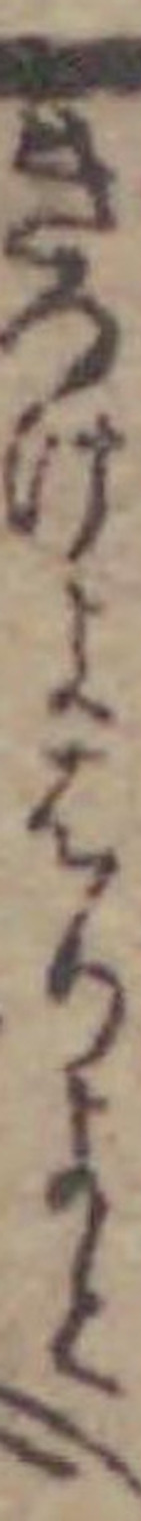きつけよはりよと
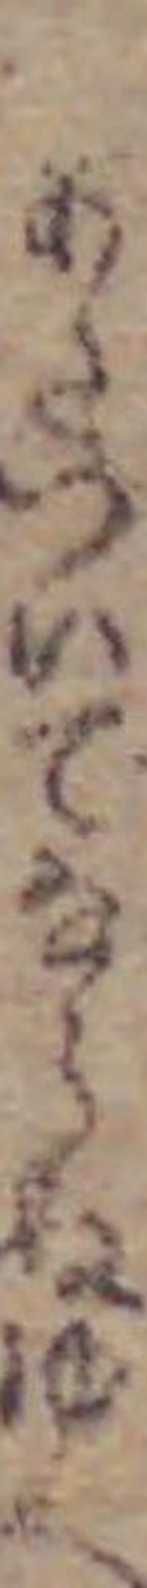あだついてならぬゆへ
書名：江戸生艶気樺焼 : 3巻
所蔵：国立国会図書館 National Diet Library, JAPAN
